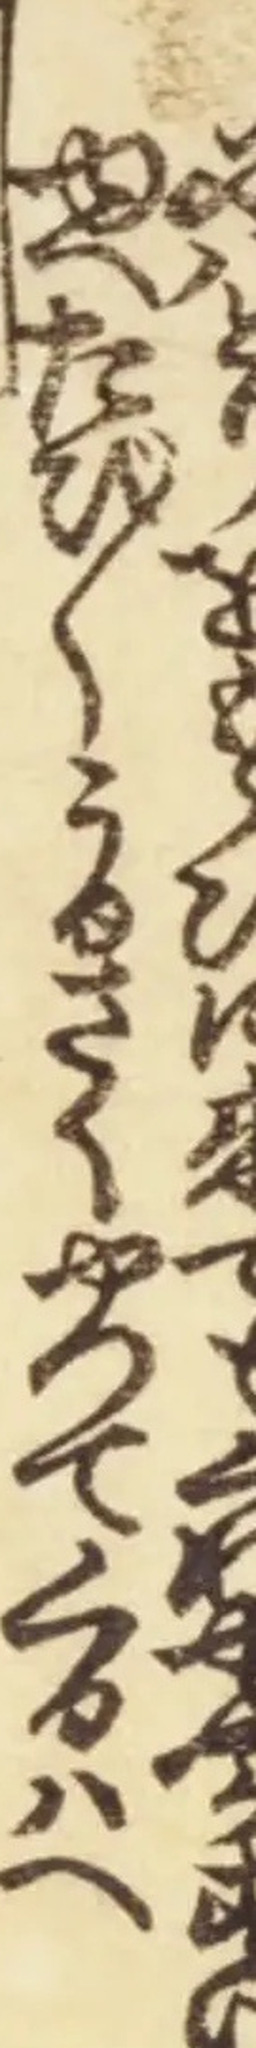ゆへたび〳〵うるさくゆつてくるハヘ
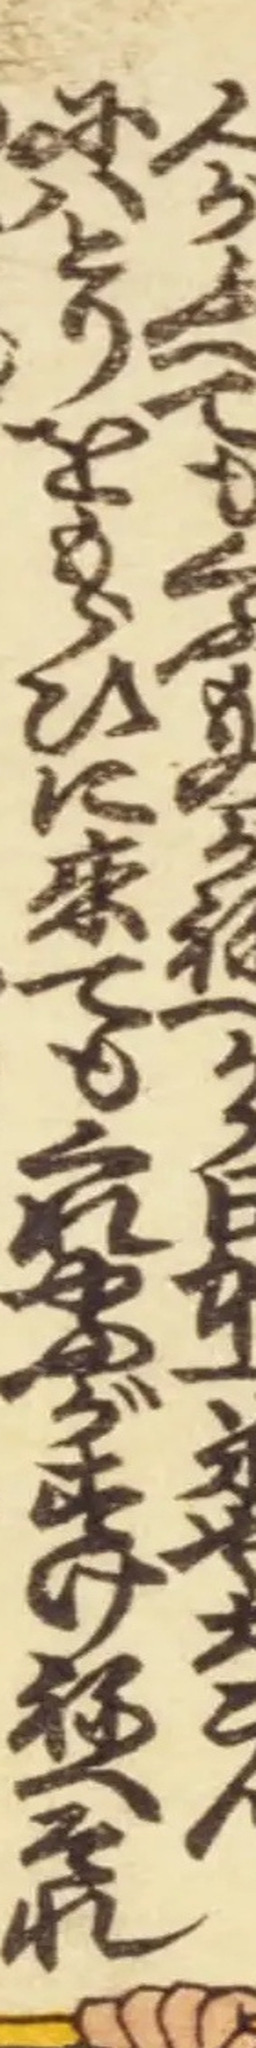にハとりをもらひに来てもくれゆふがすけねへそれ
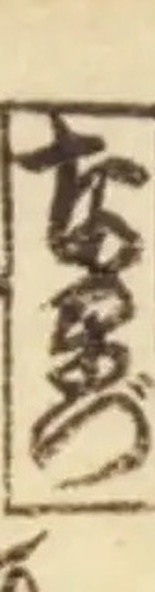なまづ
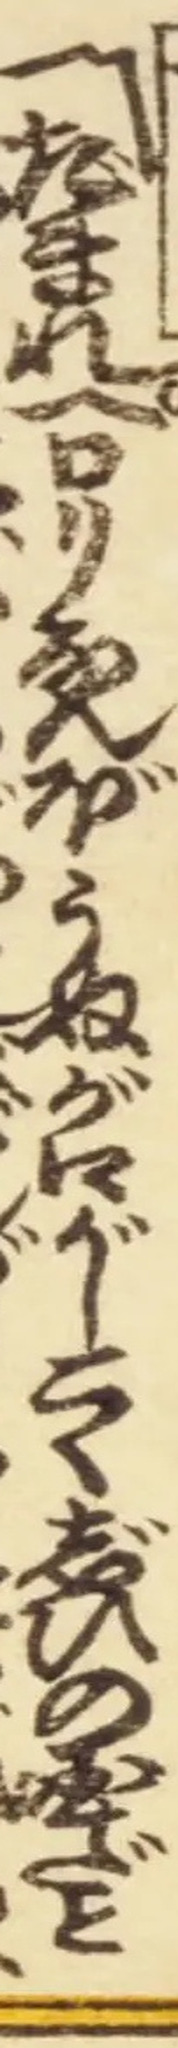〽だまれペロリなんぼうぬが口がしこくじひの国だと
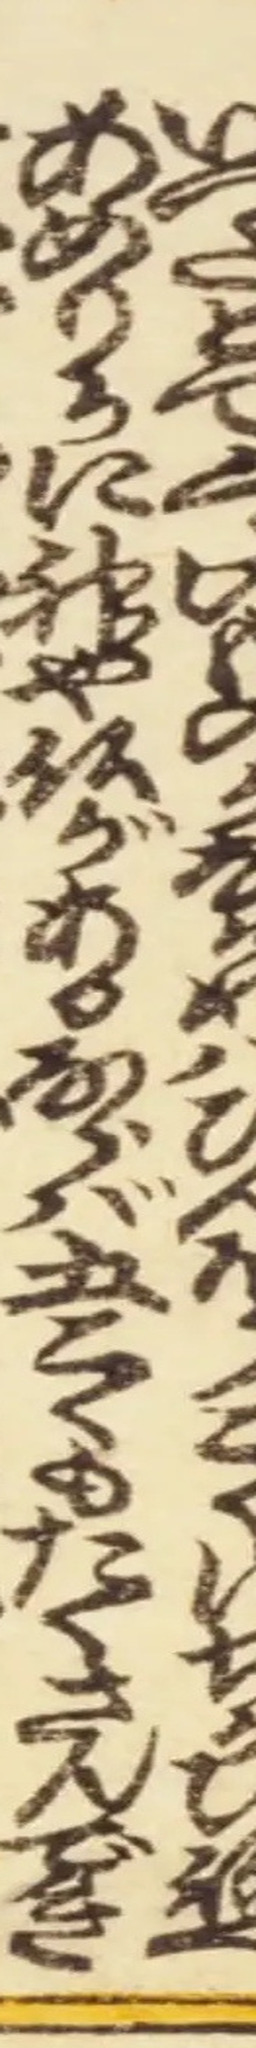あめりかに神や仏があるならバ五こくもたくさんでき
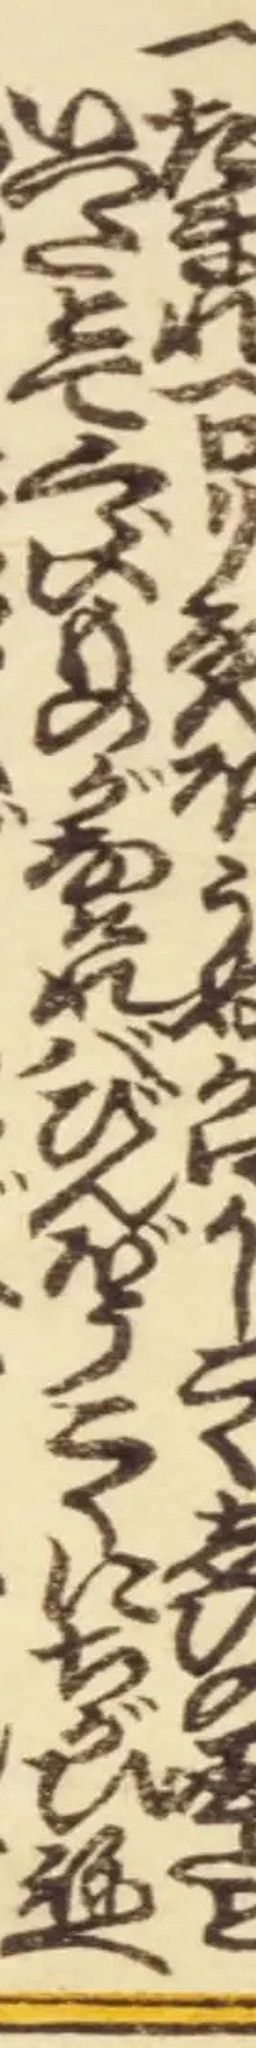いつたとてくらいものがなけれバびんぼうこくにちがひねへ
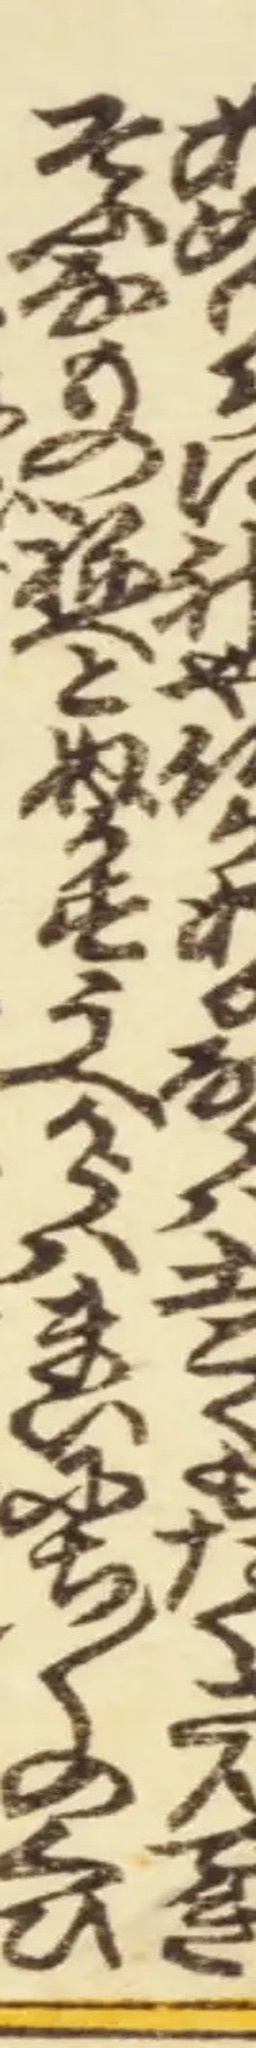そふなものねへとぬかすうへからハまいにち〳〵のくひ
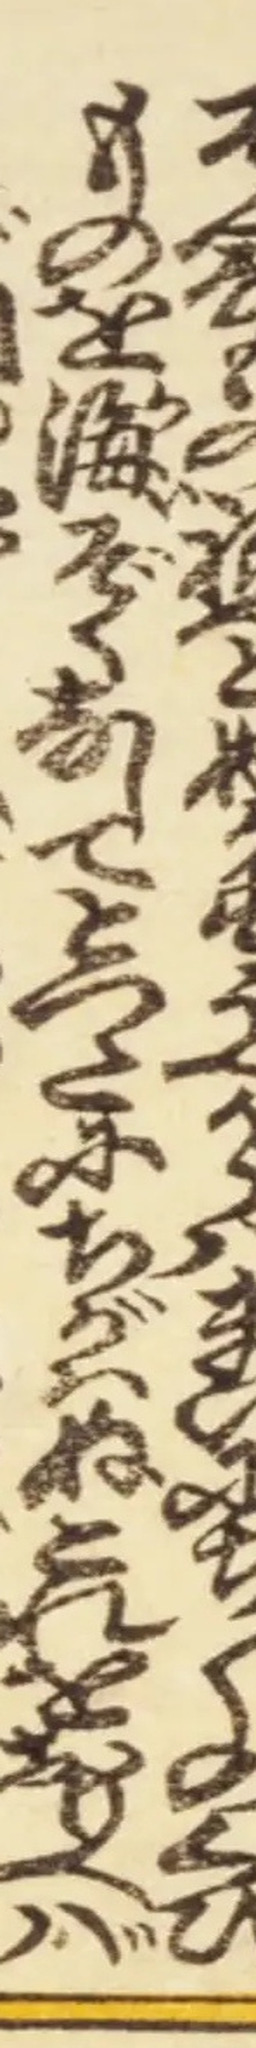ものを海ぞくなしてとつたにちがはぬこれをおもへバ
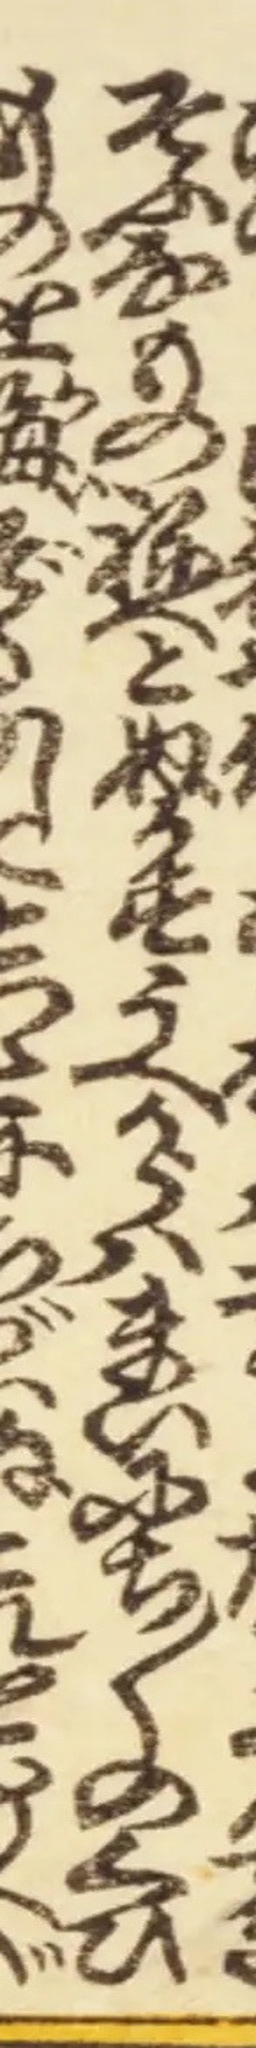そふなものねへとぬかすうへからハまいにち〳〵のくひ
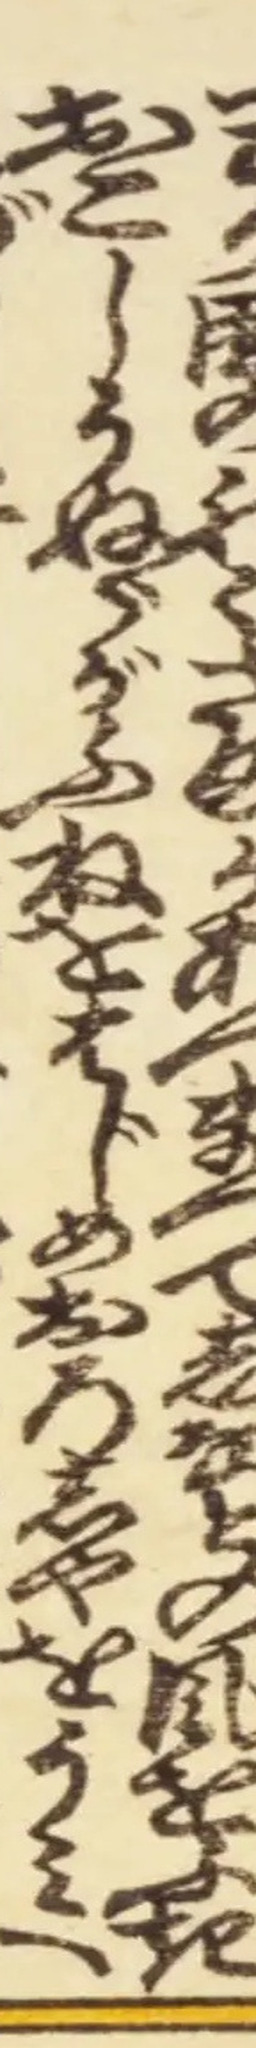おこしうぬらがふねをはじめおろしやをうみへ
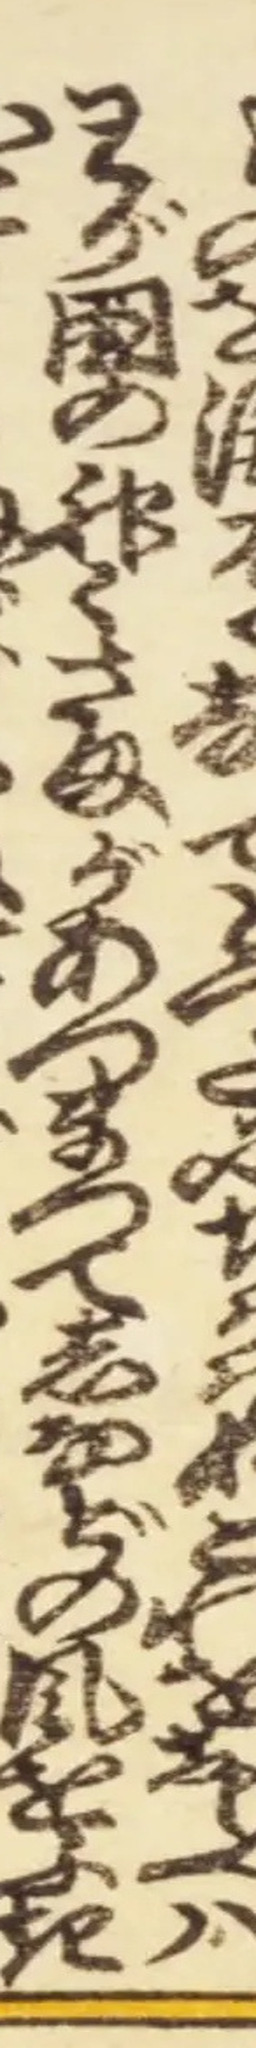わが国の神〳〵さまがあつまつてしなどの風をふき
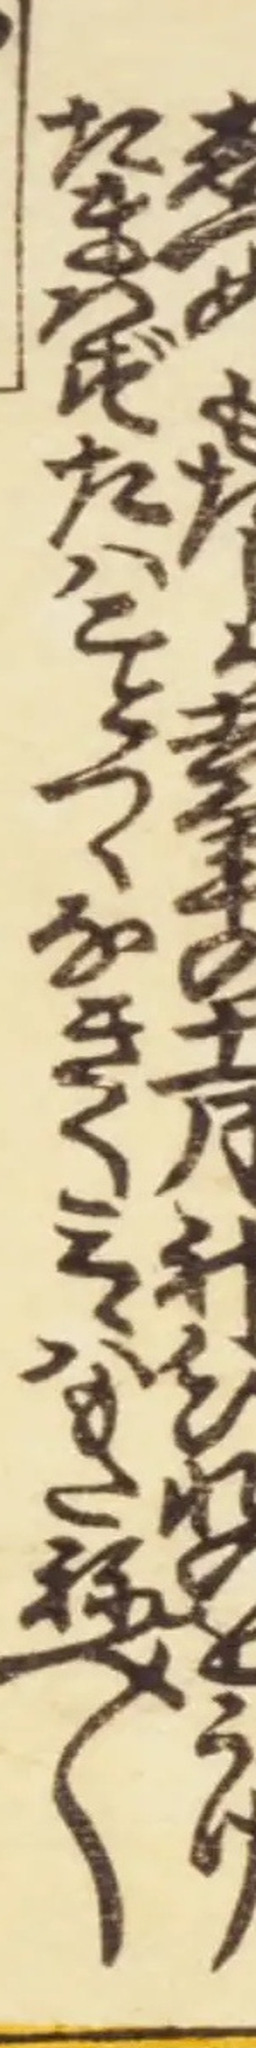たまはずたハことつゝなき〳〵みゝハもたねへ〳〵
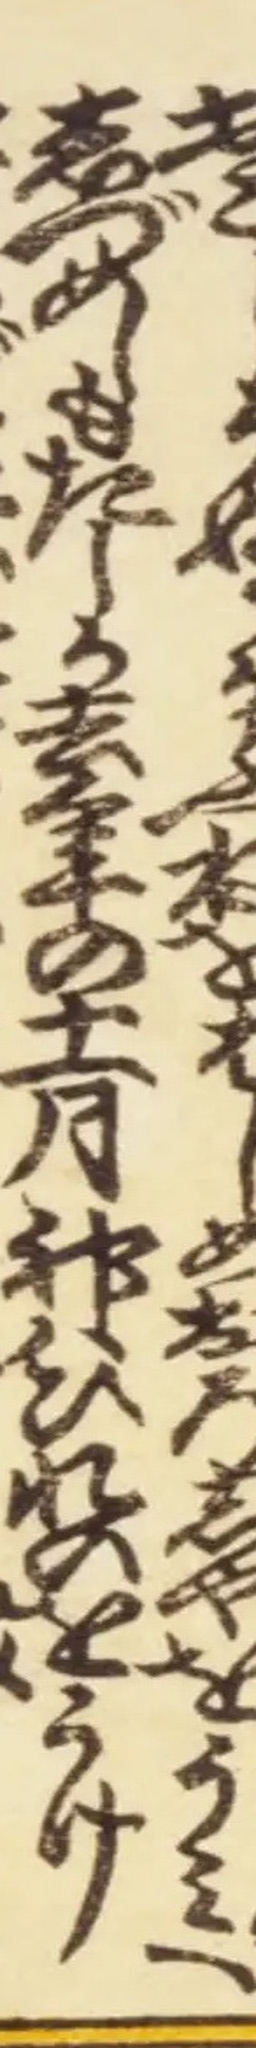しづめしもたしか去年の土月神ハひれのをうけ
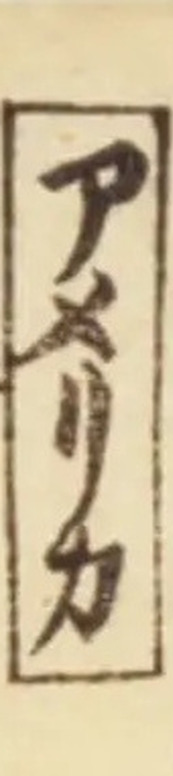アメリカ
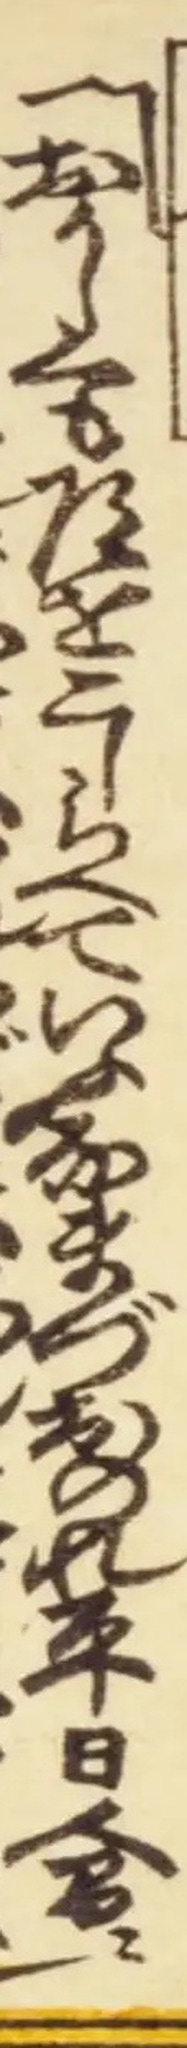〽おかしくも頭をこしらへていふなまづおのれ平日人間ニ
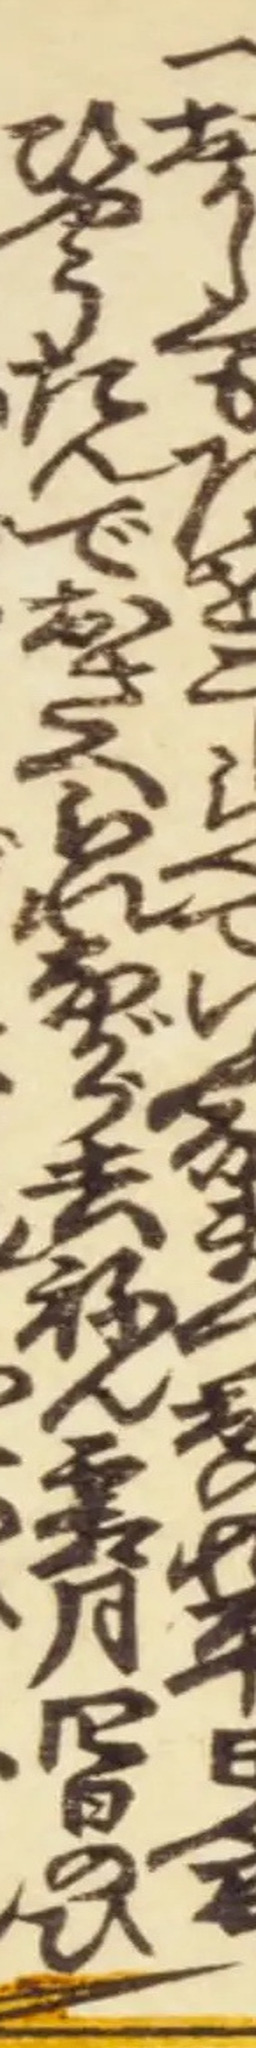ひやうたんでおさへられながら去ねん霜月四日のひ
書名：安政二年十月二日夜大地震鯰問答
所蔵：国立国会図書館 National Diet Library, JAPAN
